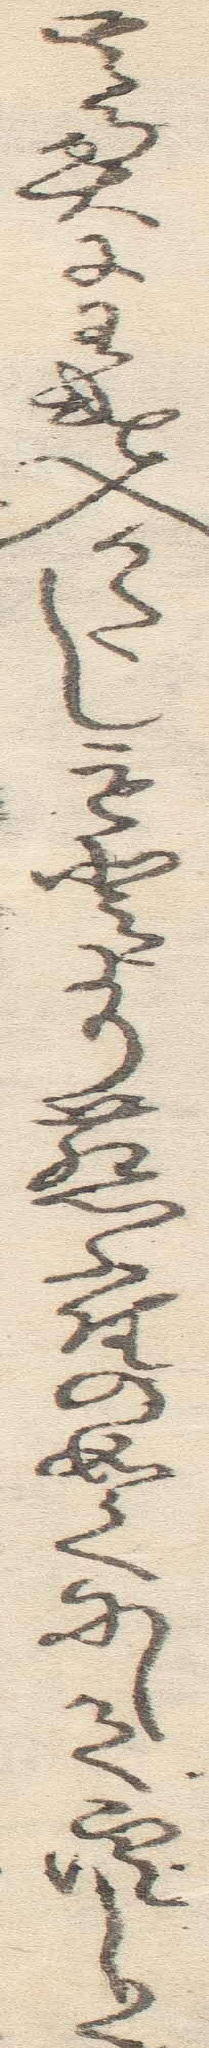其奥にわけ入かたしもとより燕雀の如くにして空しく
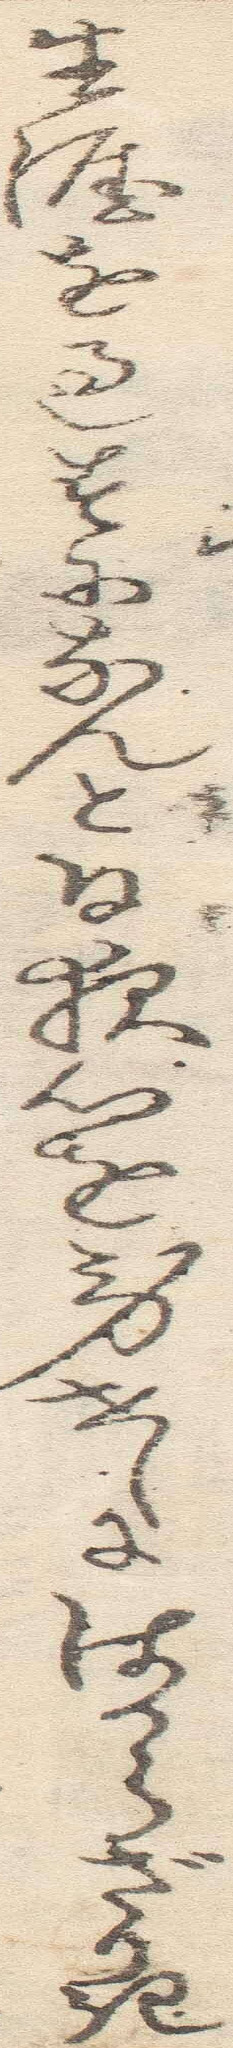生涯を過すになんと日夜心を労せしにはからざりき
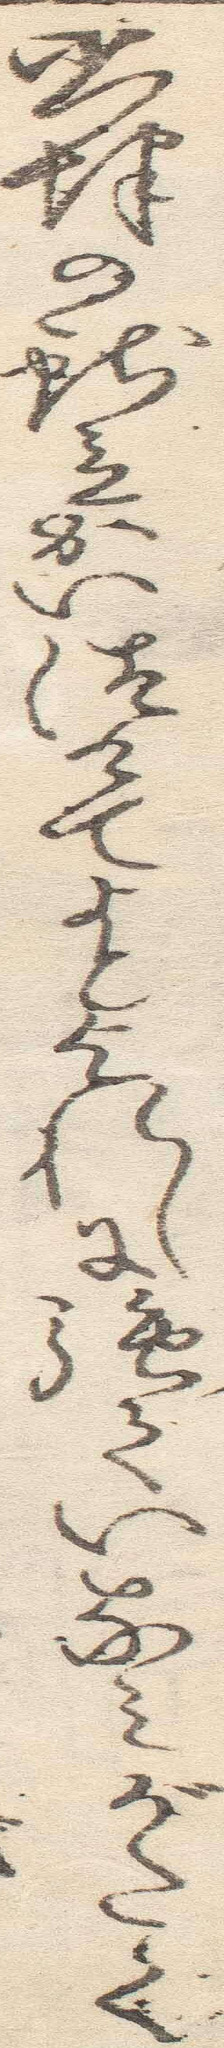書肆の献立かいつけてよと乞れしに強ていなみがたく
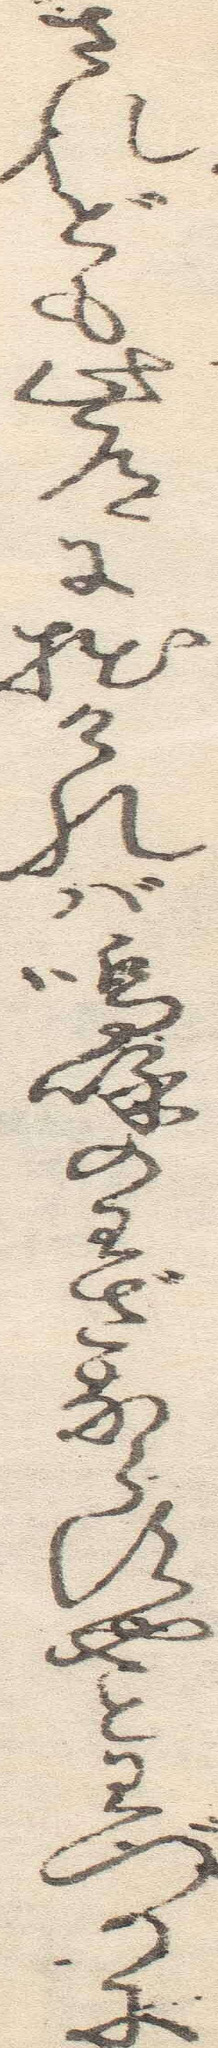されども此道に拙ければ鳴呼のわざならすやとわづかに
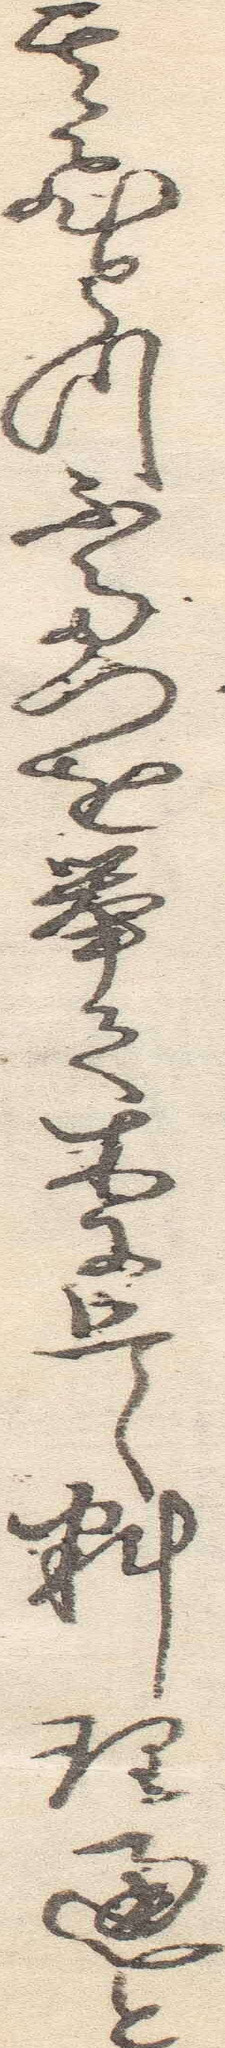其ひとつふたつを挙て木に上し料理通と
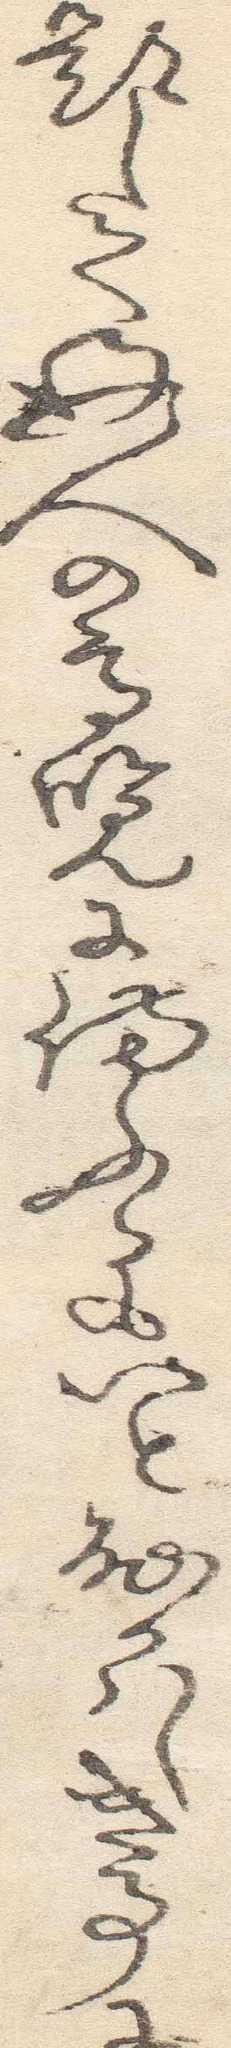題して好人の高覧に備ふるもいと恥かはしき事に
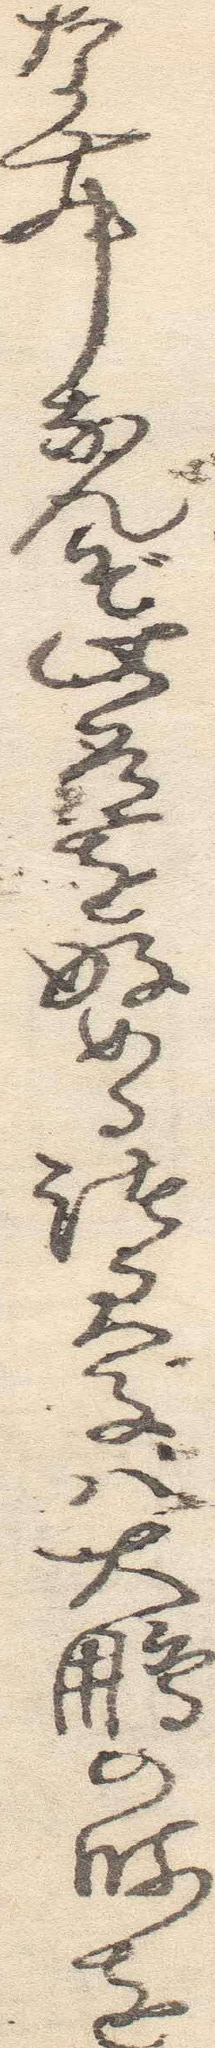なむなんぞ此道を好める諸君子は大鵬の時を
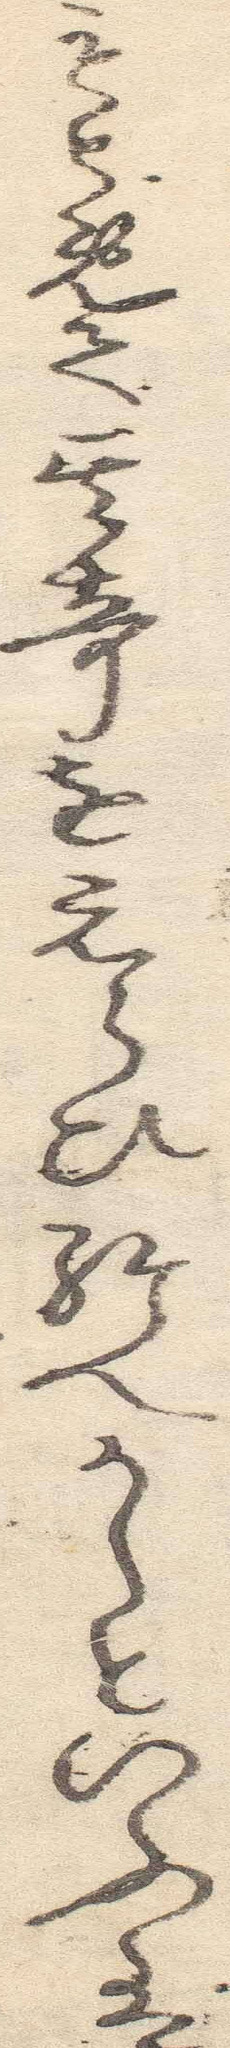もとめて其奇をえらひ給んかしといふは
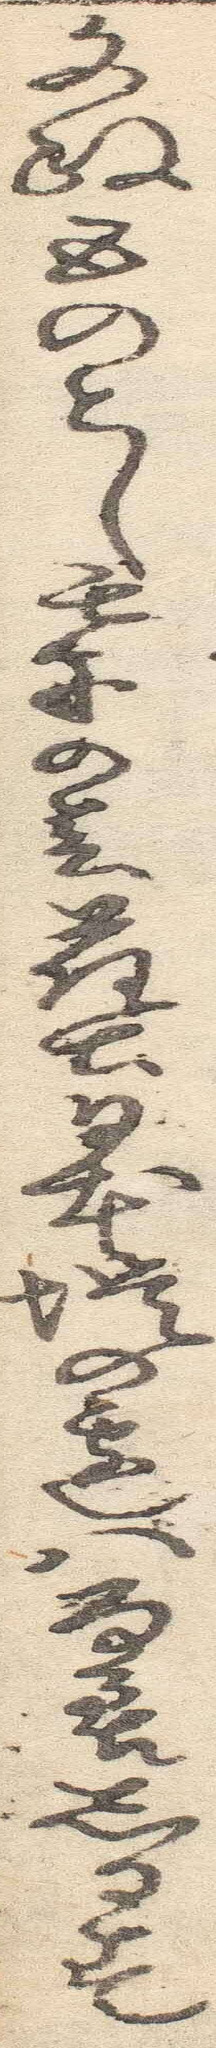文政五のとし季の春荏土日本堤の辺八百善しるす
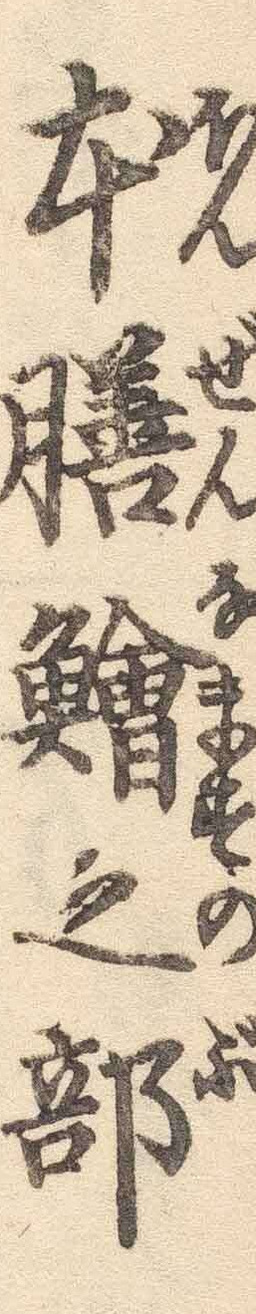本膳鱠之部

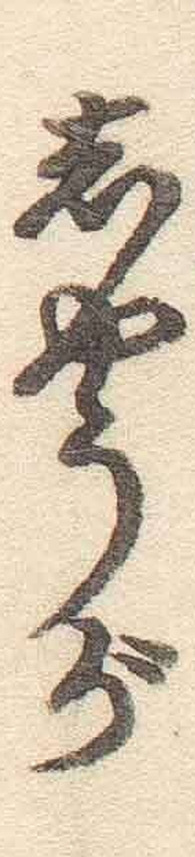しやうが
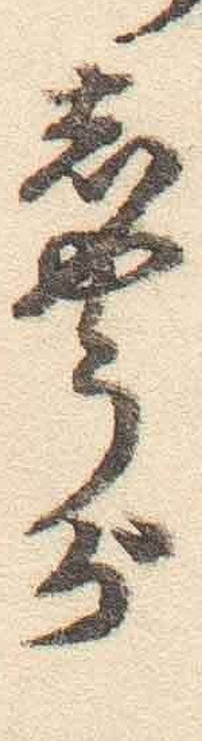しやうが
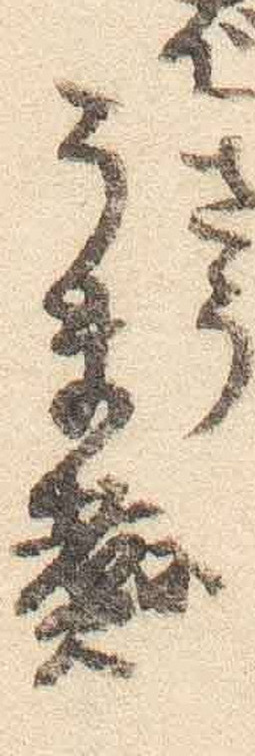うま煮
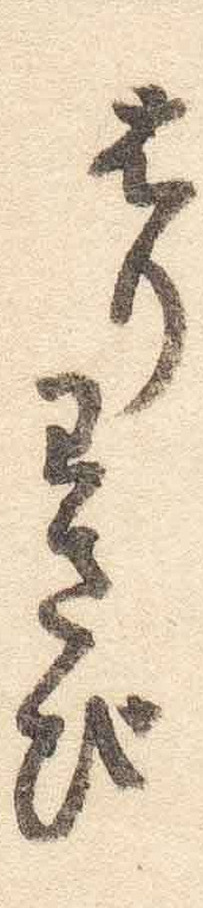はりわさび
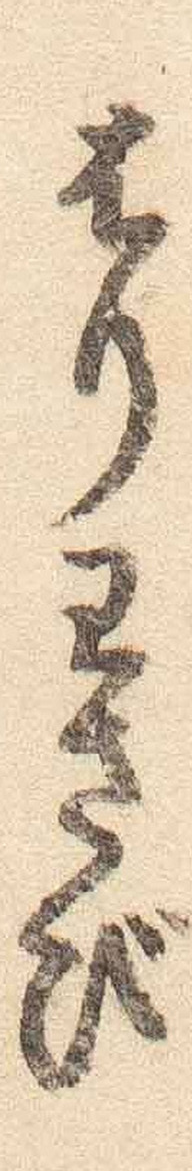はりわさび
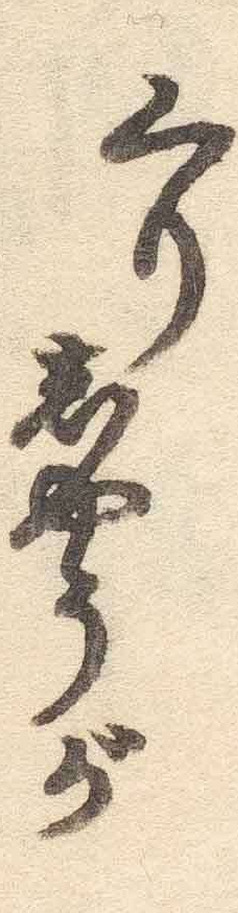しやうが
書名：料理通
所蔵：東京学芸大学附属図書館 国文学研究資料館
